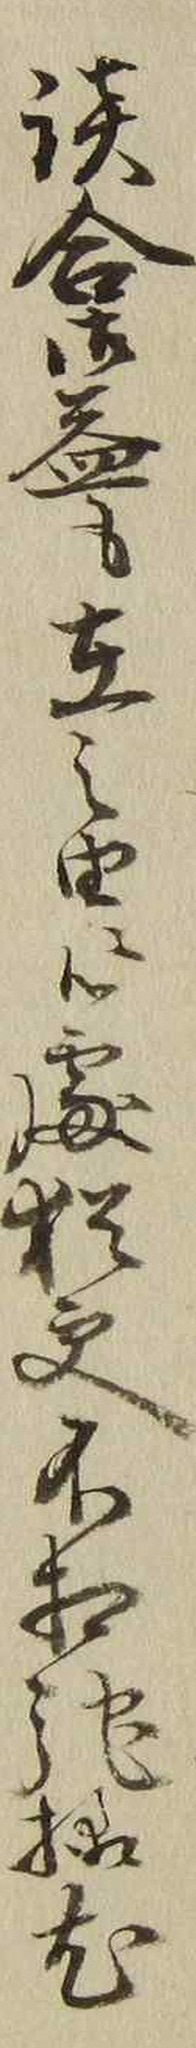談合御益も在之由ニ候處猶更不相馳様尤
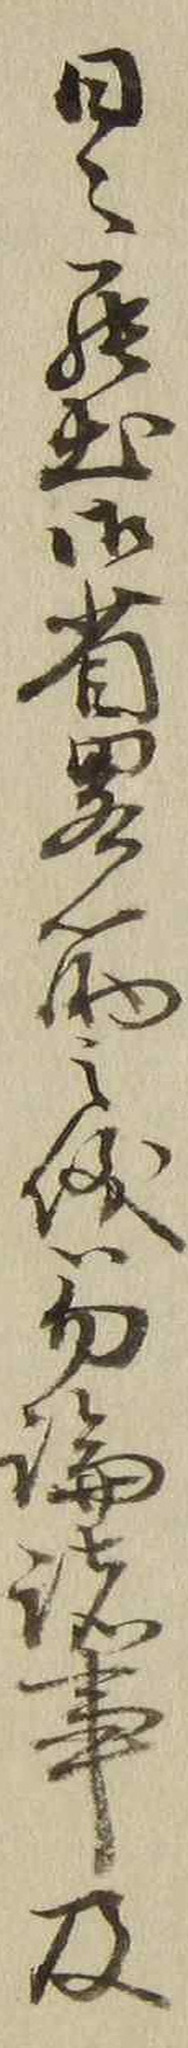日々罷出御省略筋之儀ハ勿論諸事及

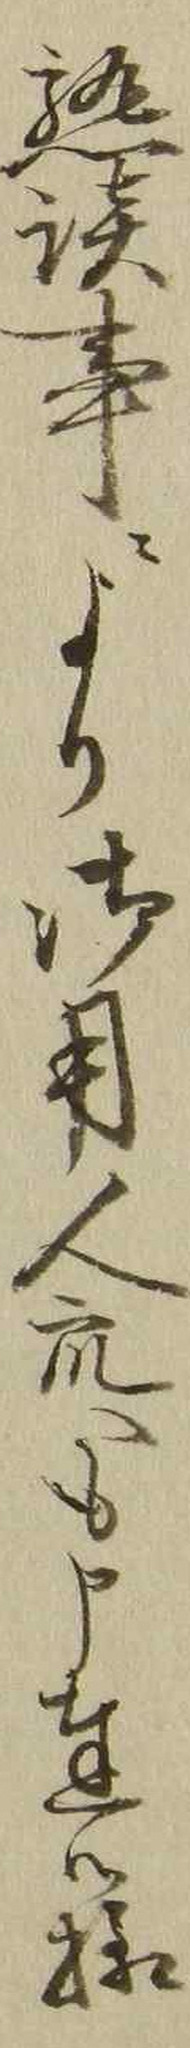熟談事ニより御用人衆へも申達候様
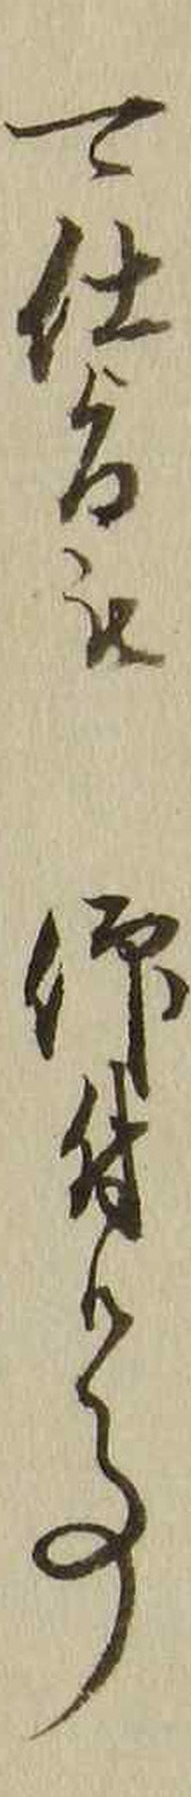可仕旨被仰付候事
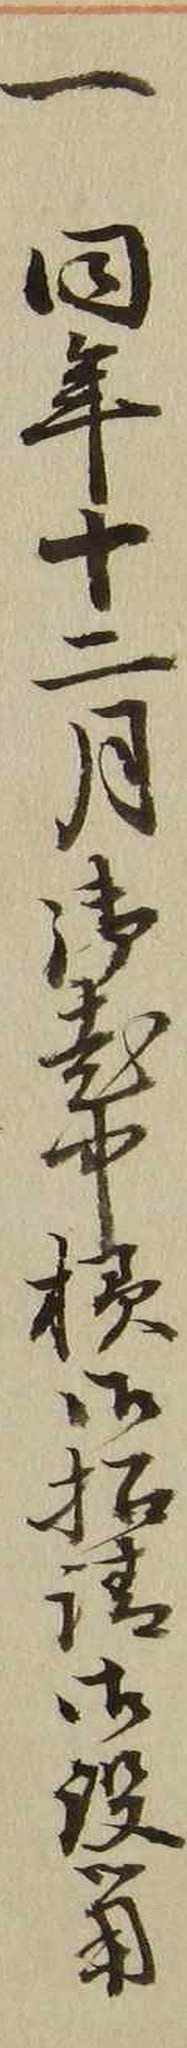一同年十二月御老中様御招請御役御用
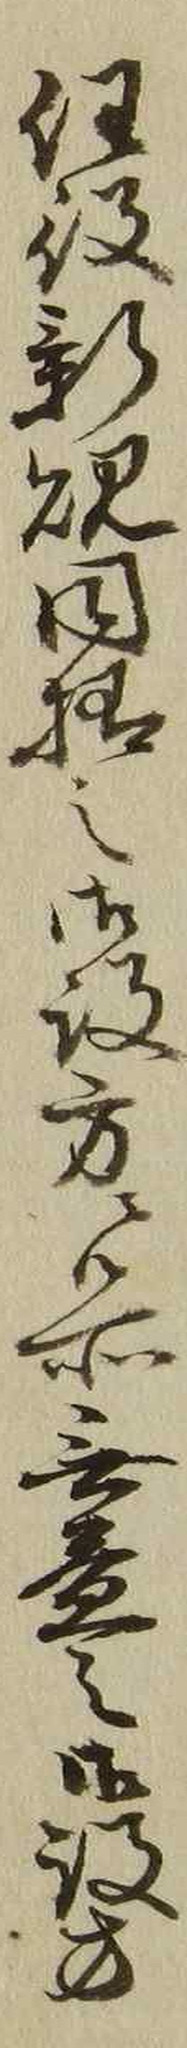任役新規同様之御役方ニ候所無意之御役方
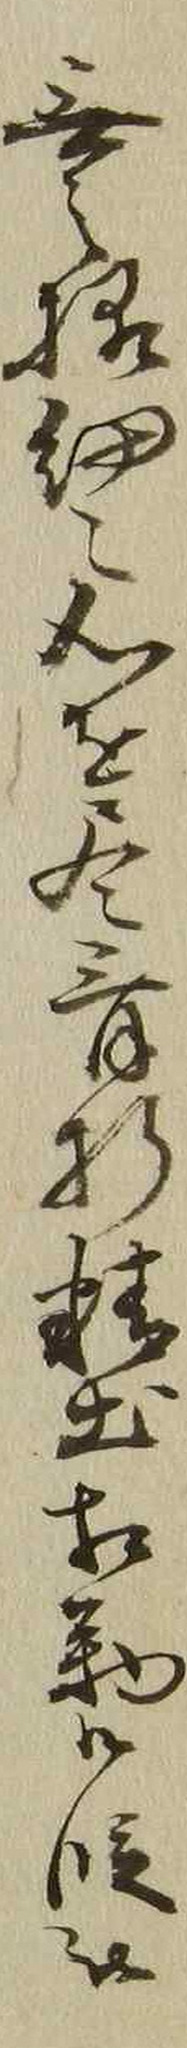無之様細々心を尽骨折精出相勤候段被
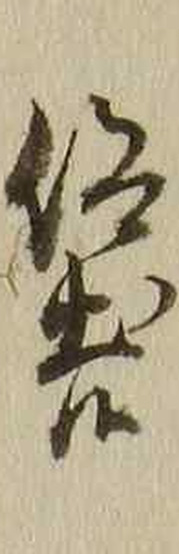仰出候
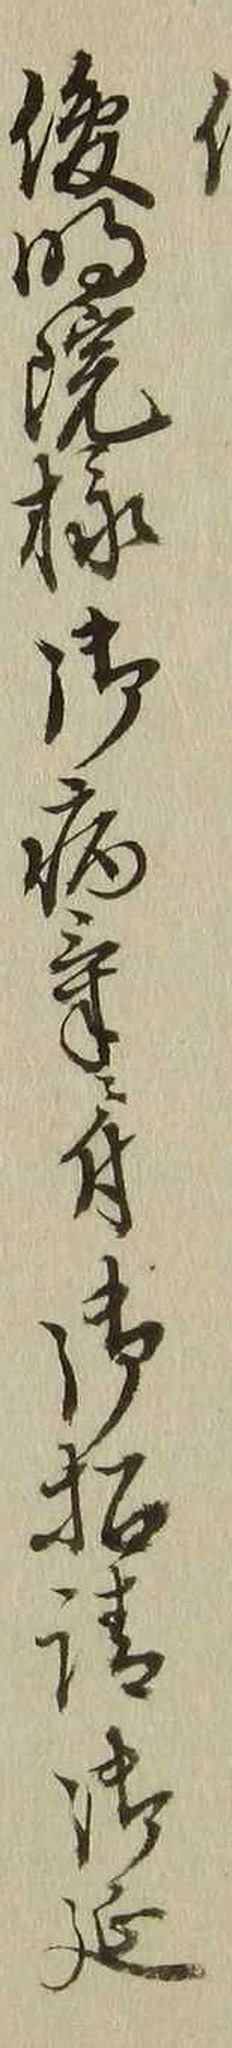俊明院様御病気ニ付御招請延
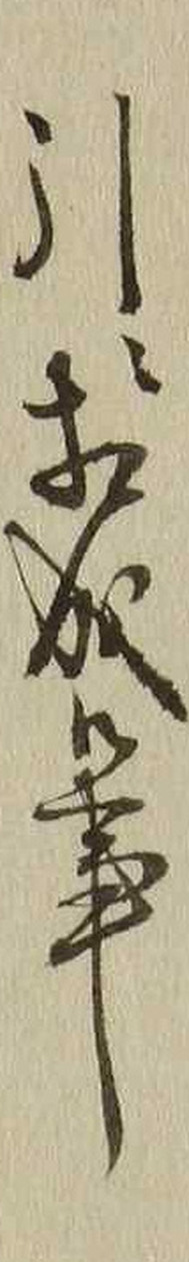引ニ相成候事
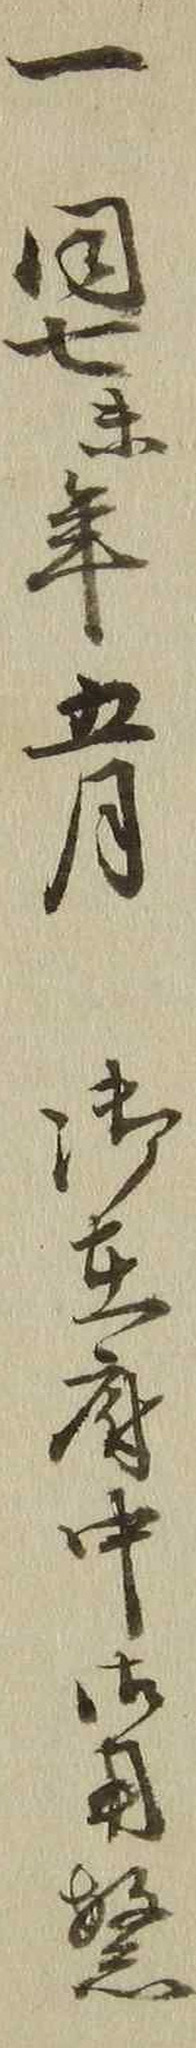一同七未年五月御在府中御用繫
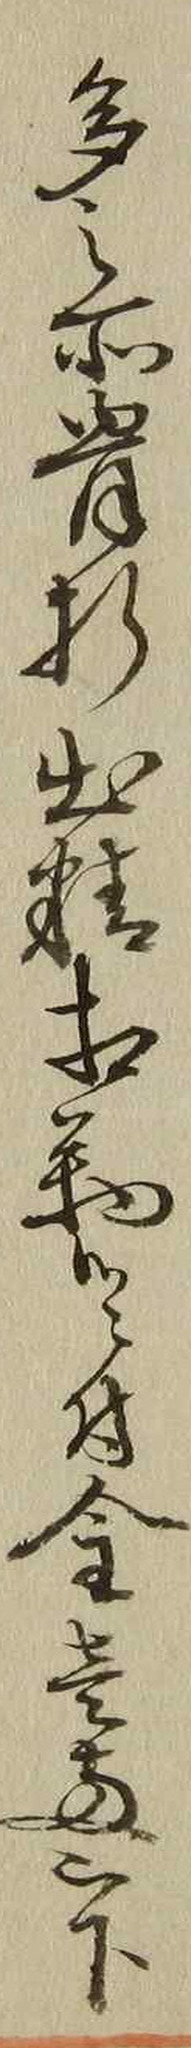多之所骨折出精相勤候ニ付金壱両被下
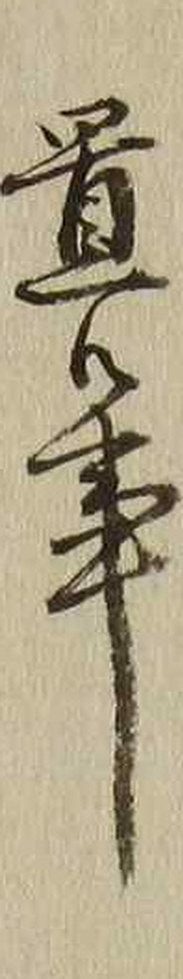置候事
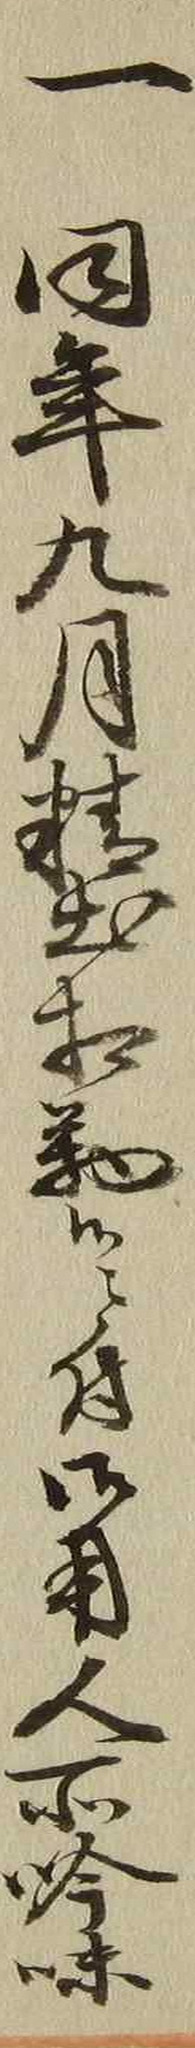一同年九月精出相勤候ニ付御用人所吟味
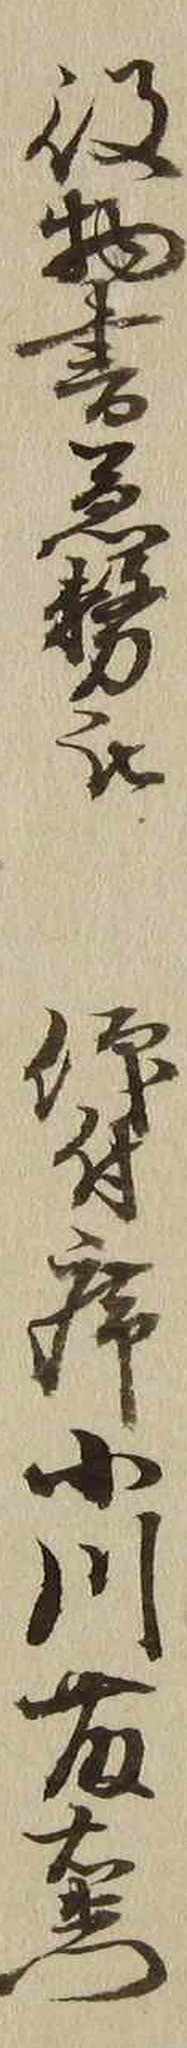役物書兼務被仰付席小川藤右衛門
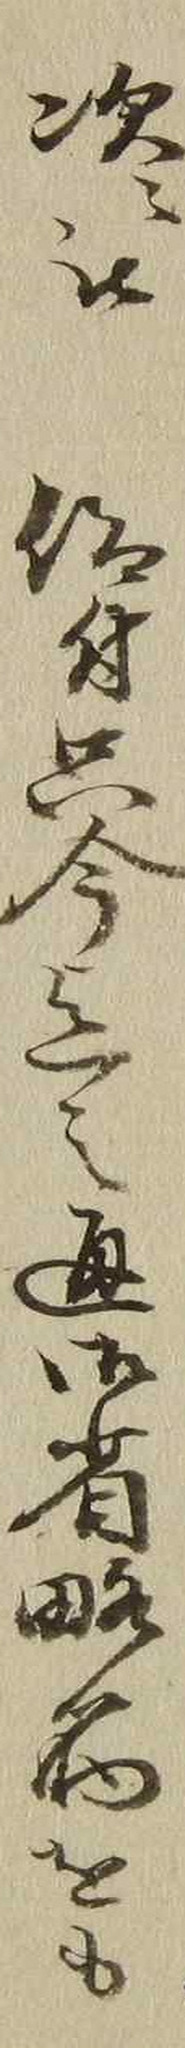次ニ被仰付只今迄之通御省略筋をも
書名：諸士系譜　巻之64　と之部7
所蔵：会津若松市立会津図書館
